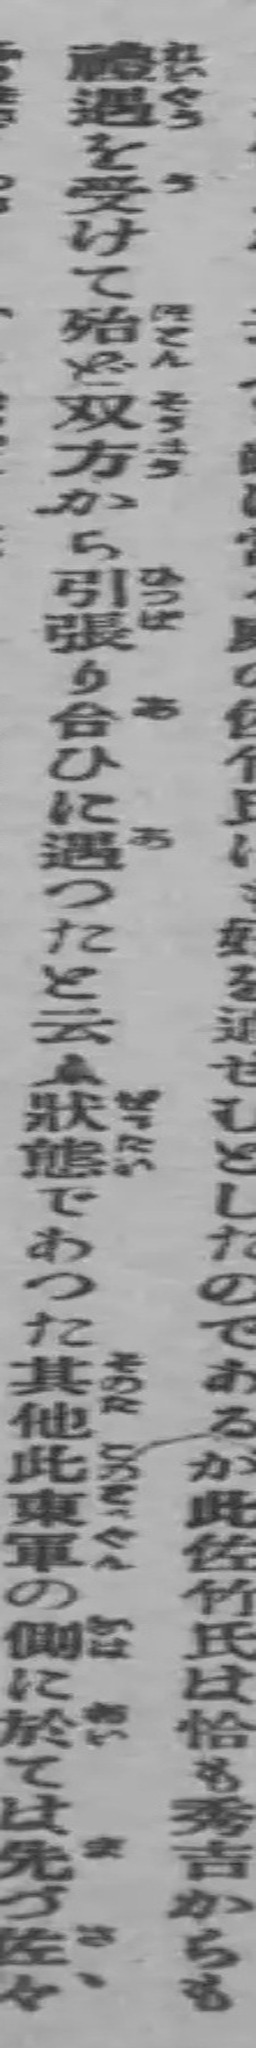礼遇を受けて殆ど双方から引張り合ひに遇つたと云ふ状態であつた其他此東軍の側に於ては先づ佐々
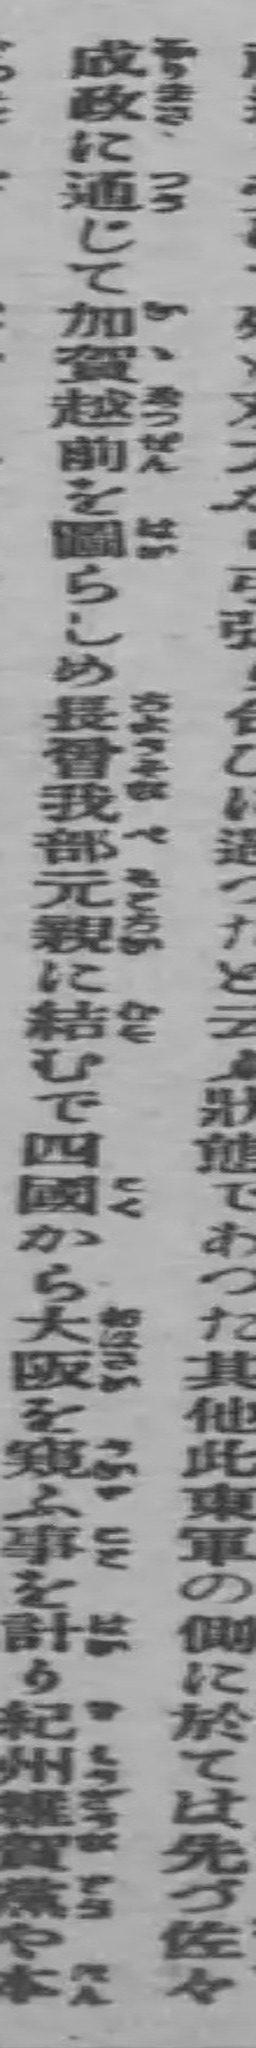成政に通じて加賀越前を図らしめ長宗我部元親に結むで四国から大阪を窺ふ事を計り紀州雑賀党や本
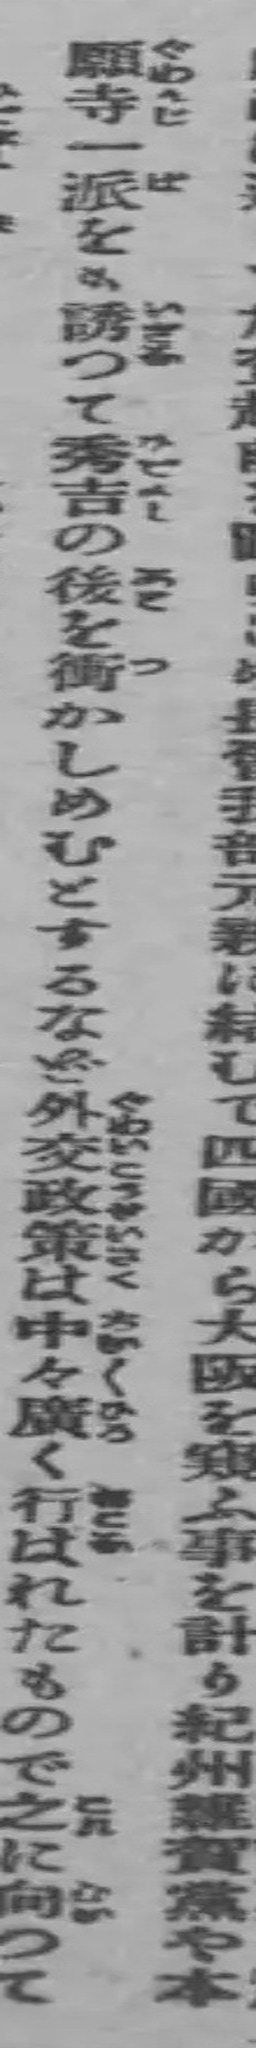願寺一派をも誘つて秀吉の後を衝かしめむとするなど外交政策は中々広く行はれたもので之に向つて
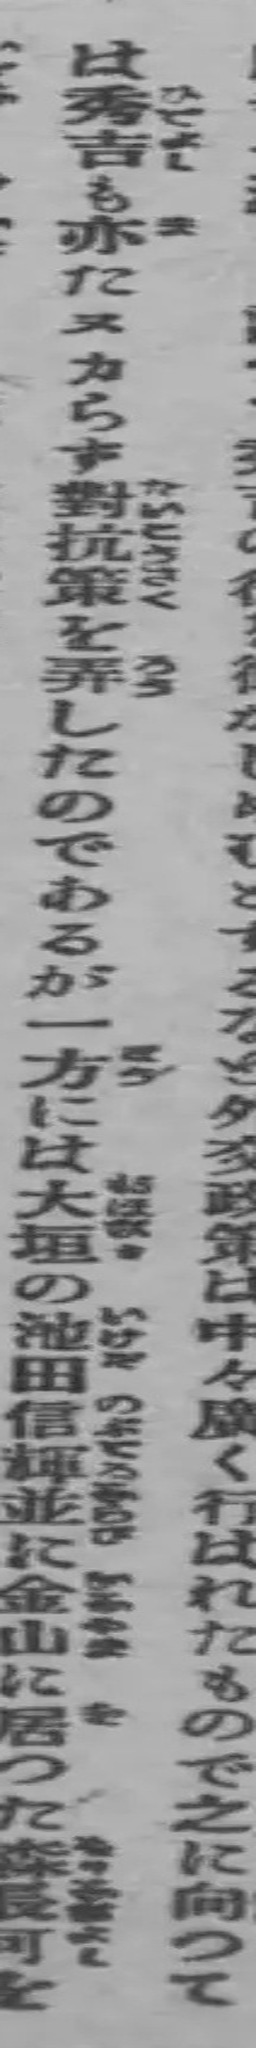は秀吉も亦たヌカらず対抗策を弄したのであるが一方には大垣の池田信輝並に金山に居つた森長可を
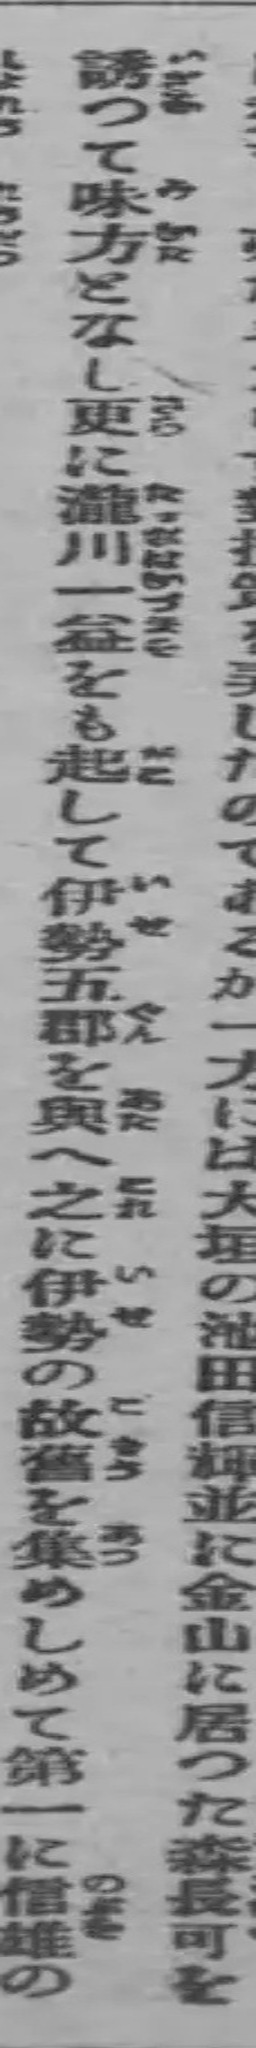誘つて味方となし更に瀧川一益をも起して伊勢五郡を与へ之に伊勢の故旧を集めしめて第一に信雄の
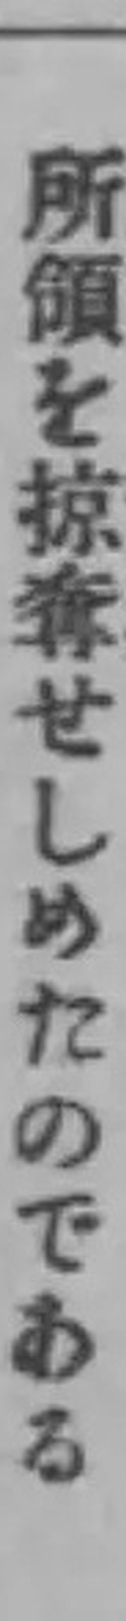所領を掠奪せしめたのである
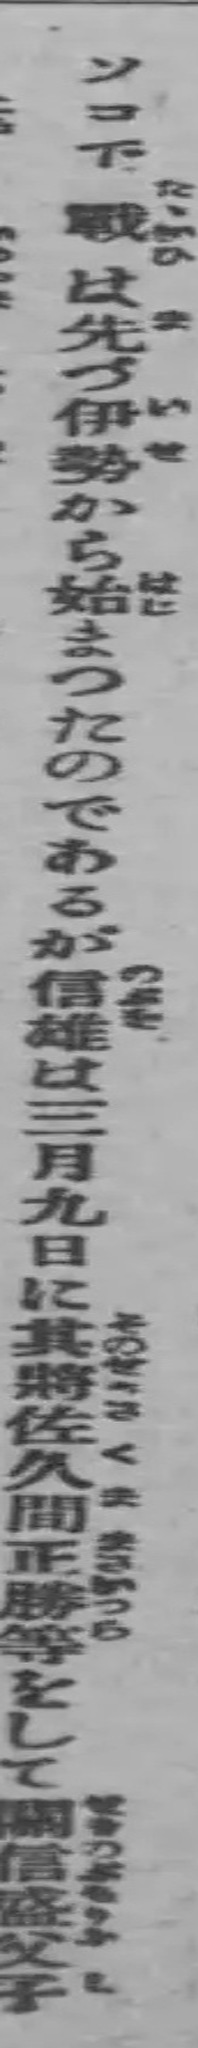ソコで戦は先づ伊勢から始まつたのであるが信雄は三月九日に其将佐久間正勝等をして関信盛父子
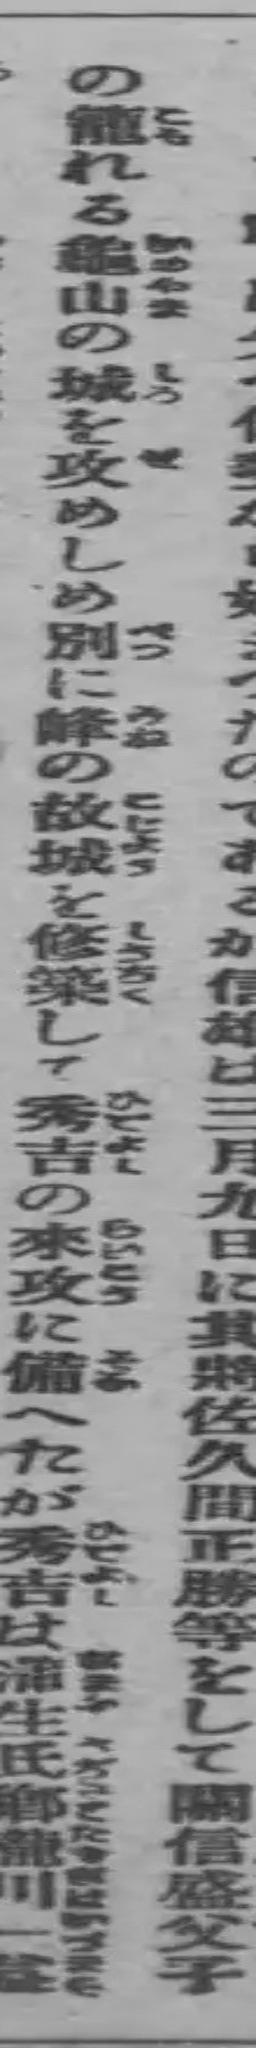峰城の籠れる亀山の城を攻めしめ別に峰の故城を修築して秀吉の来攻に備へたが秀吉は蒲生氏郷瀧川一益
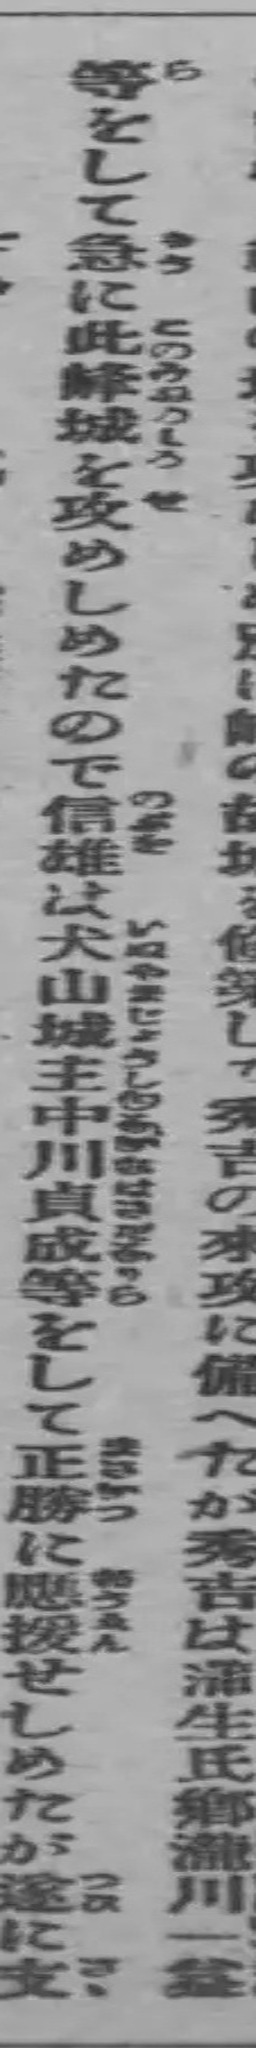等をして急に此峰城を攻めしめたので信雄は犬山城主中川貞成等をして正勝に応援せしめたが遂に支
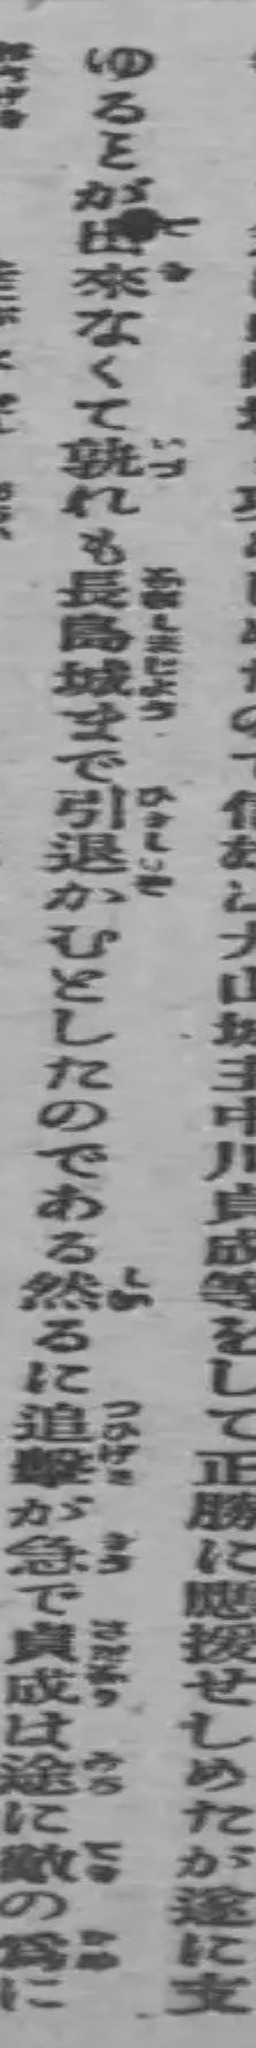ゆることが出来なくて孰れも長島城まで引退かむとしたのである然るに追撃が急で貞成は途に敵の為に
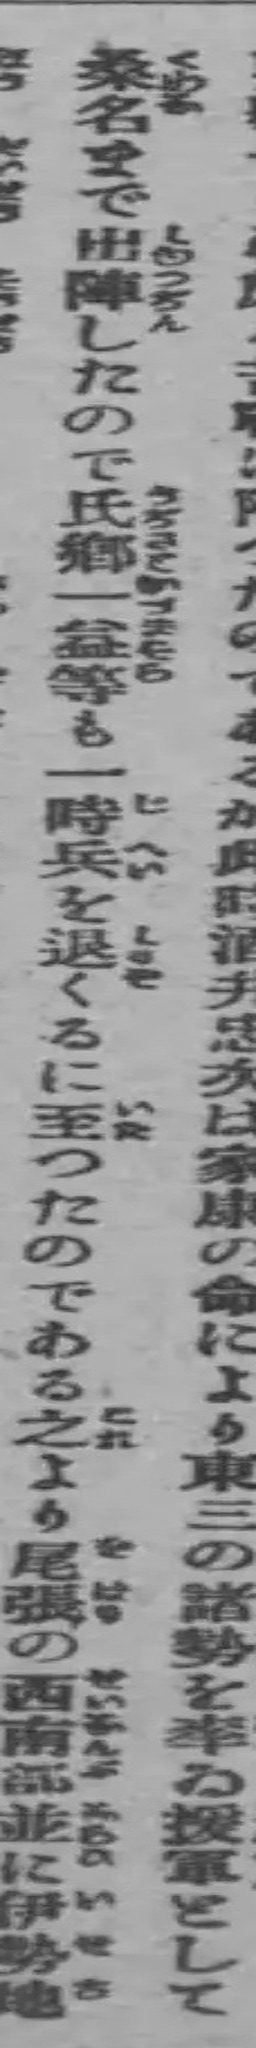桑名まで出陣したので氏郷一益等も一時兵を退くるに至つたのである之より尾張の西南部並に伊勢地
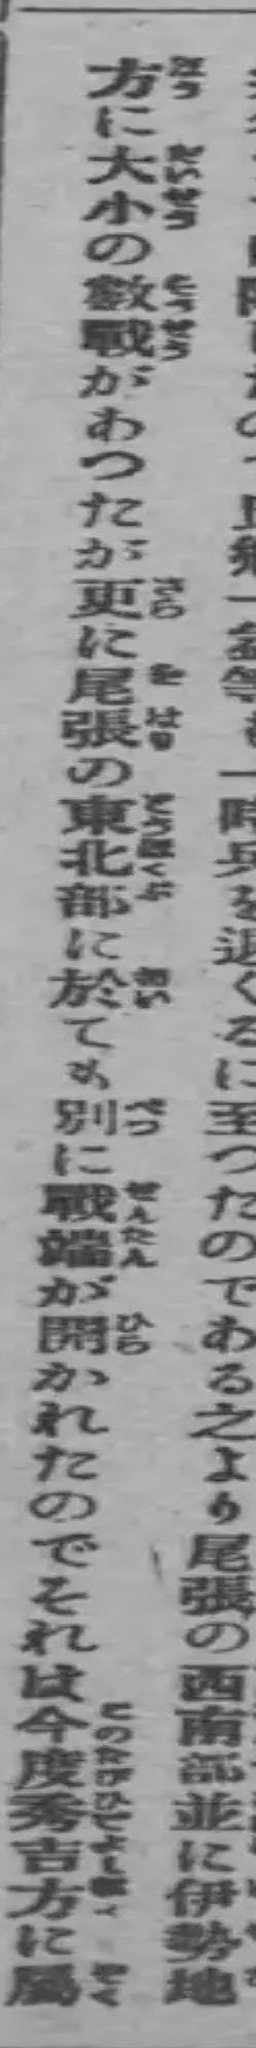犬山城陥る方に大小の数戦があつたが更に尾張の東北部に於ても別に戦端が開かれたのでそれは今度秀吉方に属
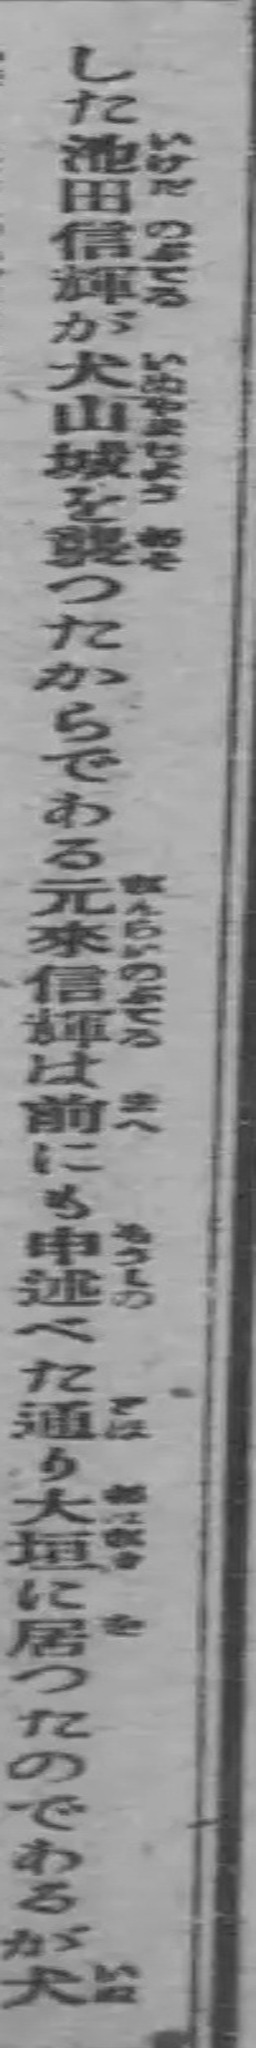した池田信輝が犬山城を襲つたからである元来信輝は前にも申述べた通り大垣に居つたのであるが犬
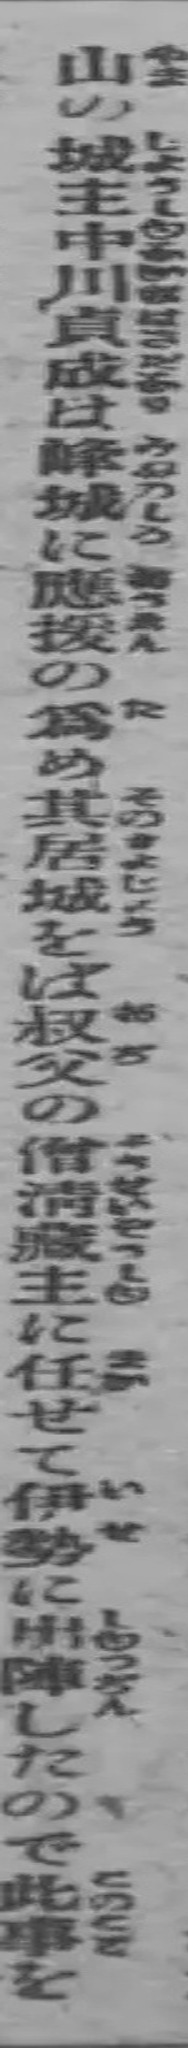山の城主中川貞成は峰城に応援の為め其居城をば叔父の僧清蔵主に任せて伊勢に出陣したので此事を
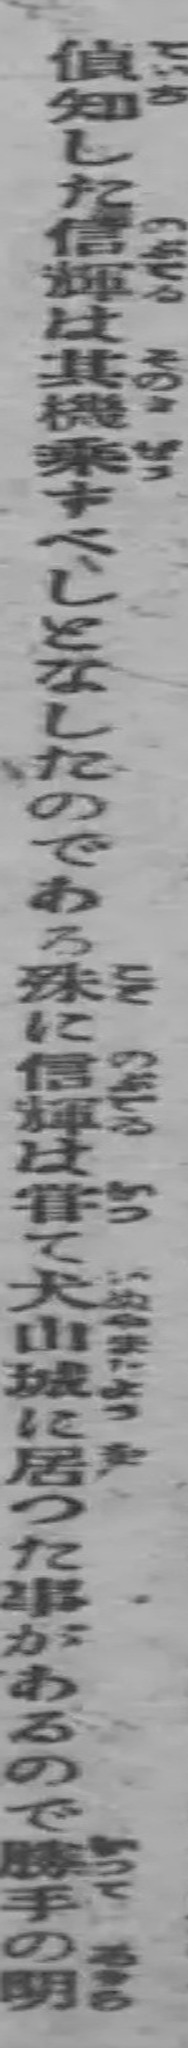偵知した信輝は其機乗すべしとなしたのである殊に信輝は嘗て犬山城に居つた事があるので勝手の明
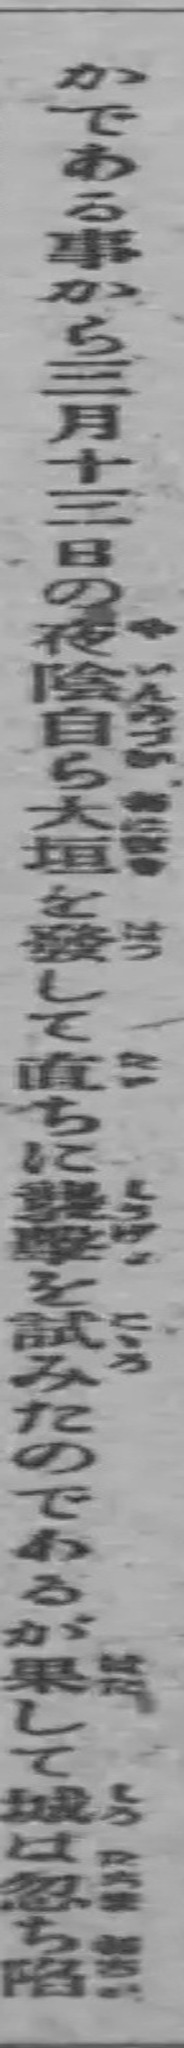かである事から三月十三日の夜陰自ら大垣を発して直ちに襲撃を試みたのであるが果して城は忽ち陥
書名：豊橋市史談
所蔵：国立国会図書館 National Diet Library, JAPAN
